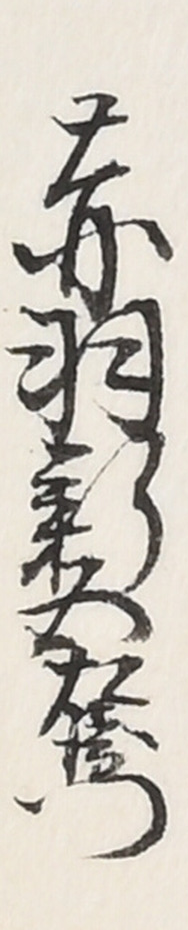赤羽新五左衛門
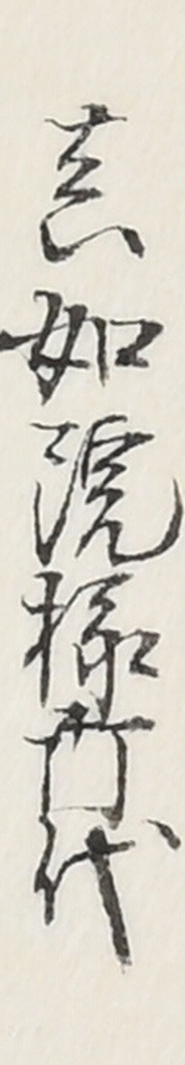真如院様御代
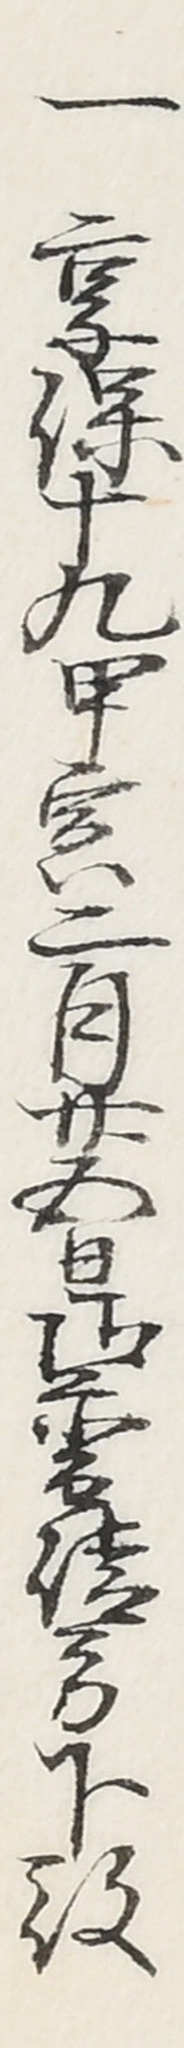一享保十九甲寅二月廿五日御普請方下役
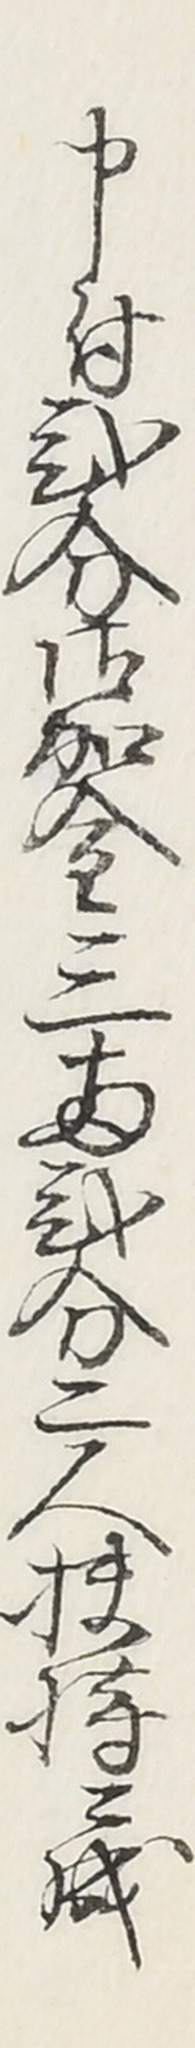申付弐分御加金三両弐分二人扶持ニ成
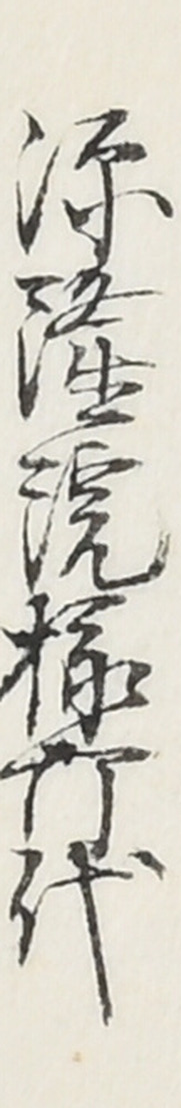源隆院様御代
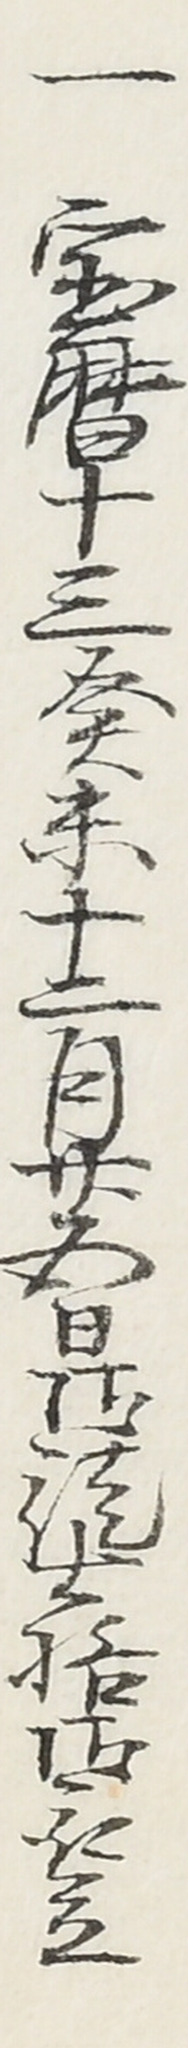一宝暦十三癸未十二月廿五日御徒士格御取立
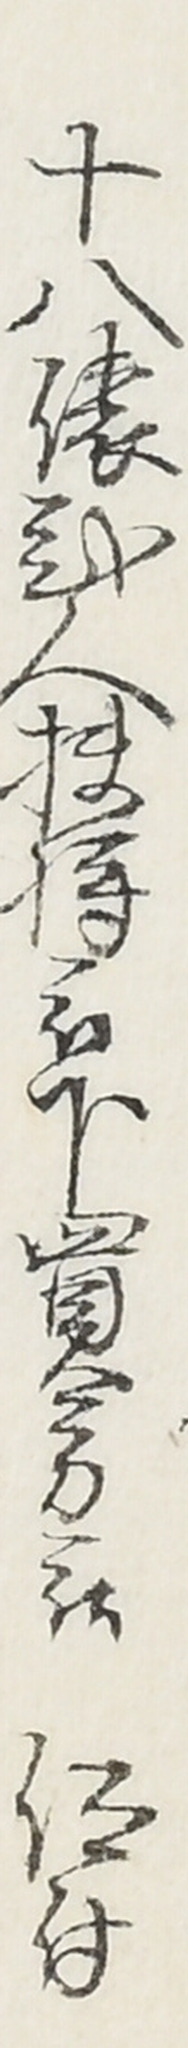十八俵弐扶持被下買方被仰付
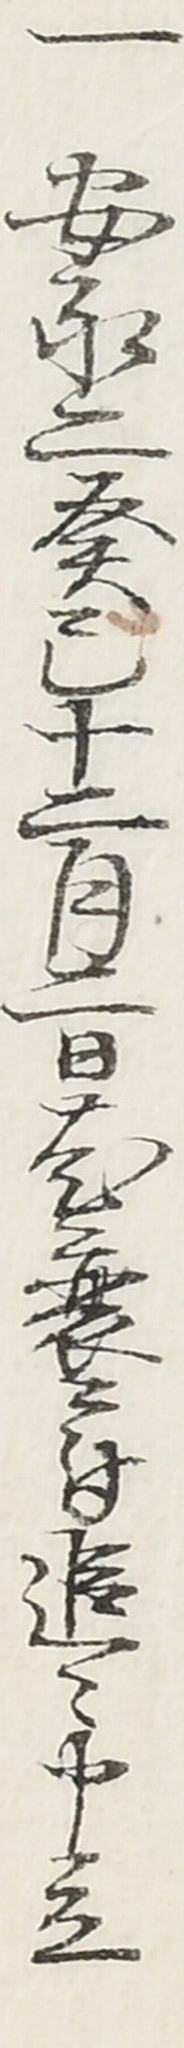一安永二癸巳十二月二日老衰ニ付追々申立
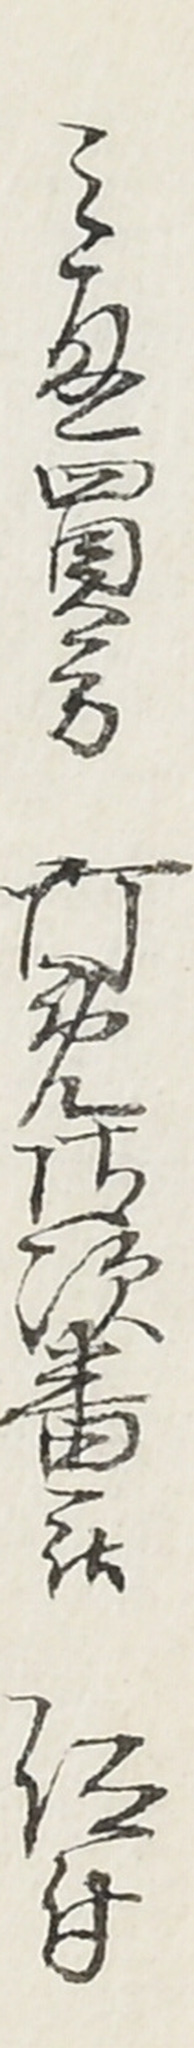之通買方御免御次番被仰付
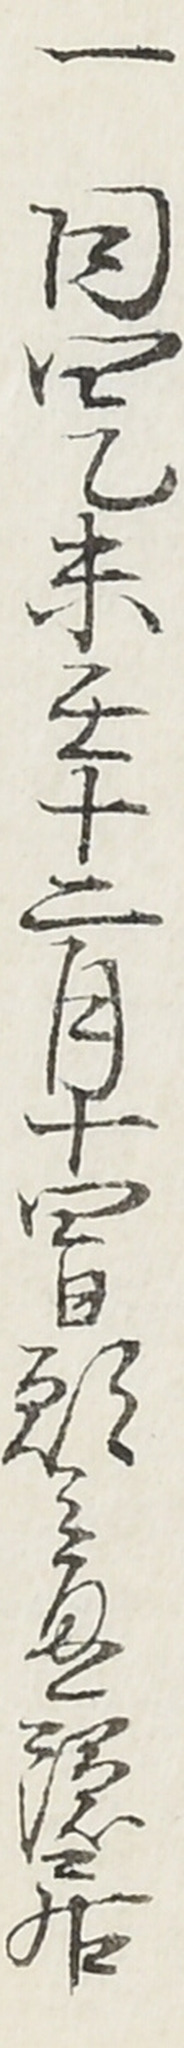一同四乙未閏十二月十四日願之通隠居
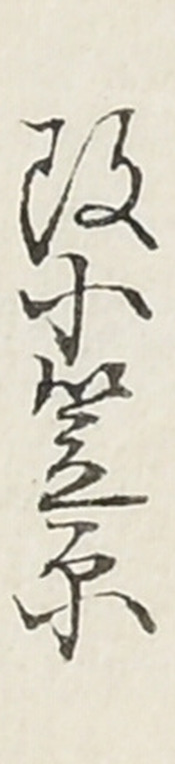改小笠原
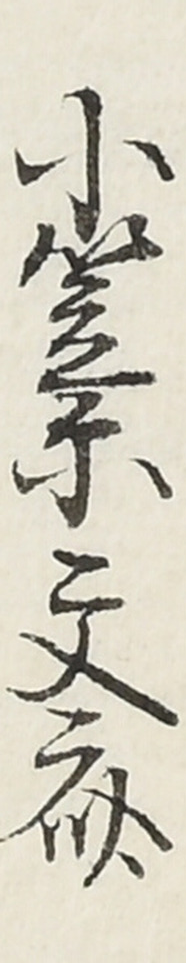小笠原文斎
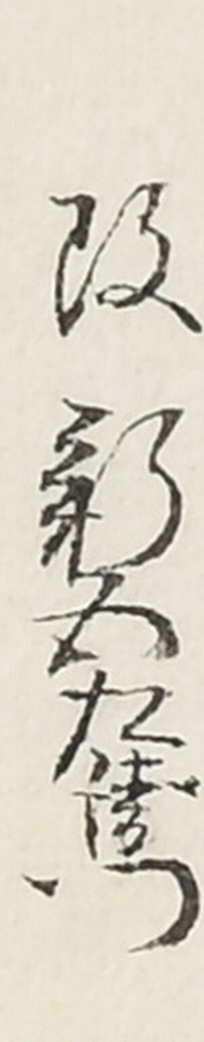改新五左衛門
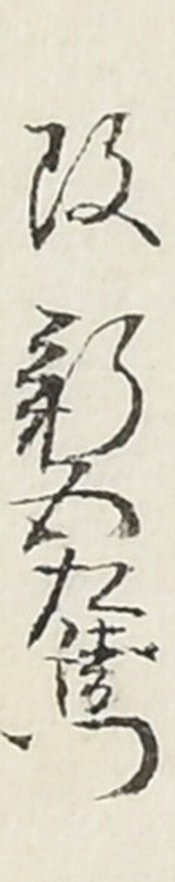改新五左衛門
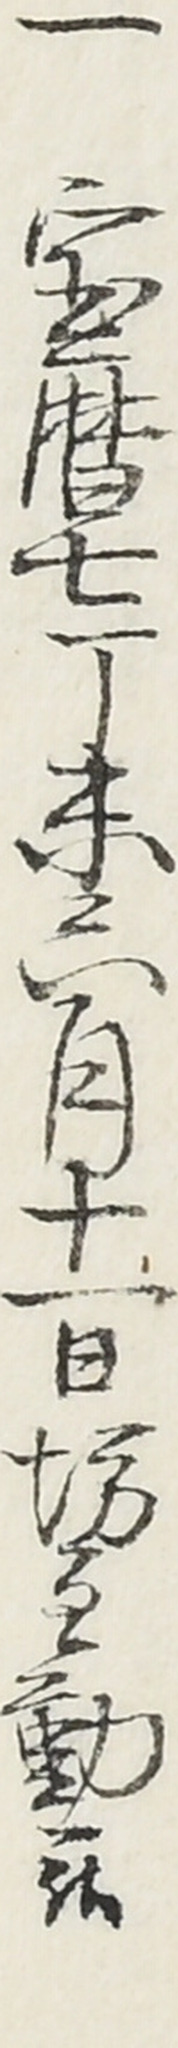一宝暦七丁未六月十一日坊主勤被
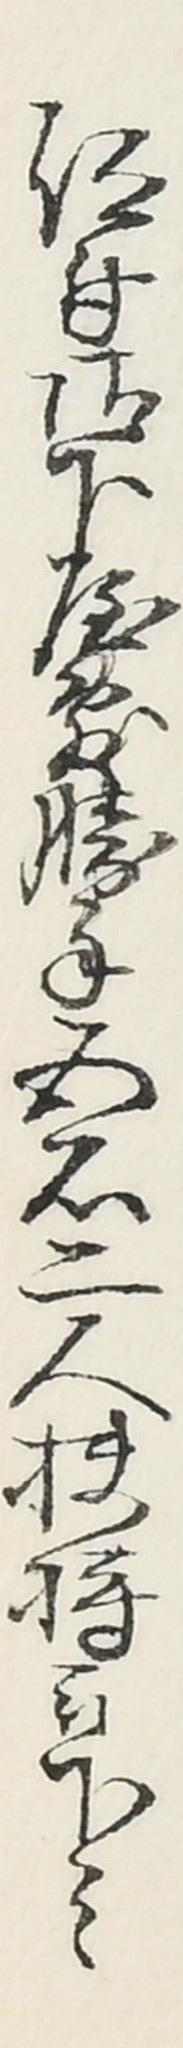仰付御下屋敷勝手五石二人扶持被下之
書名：無足諸士勤仕録（四）
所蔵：伊那市立高遠町図書館・合同会社AMANE
